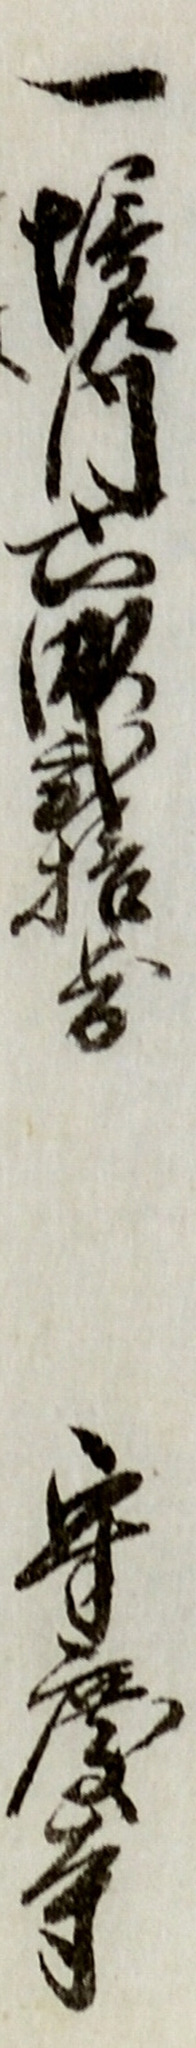一境内六畝弐拾歩守慶寺
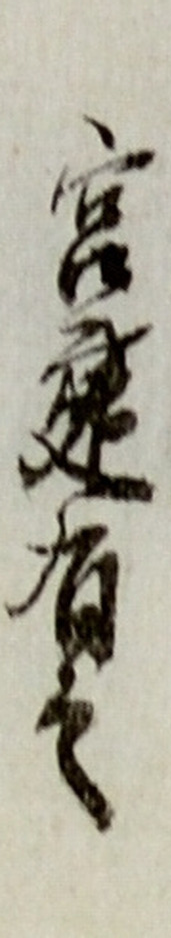宮建有之

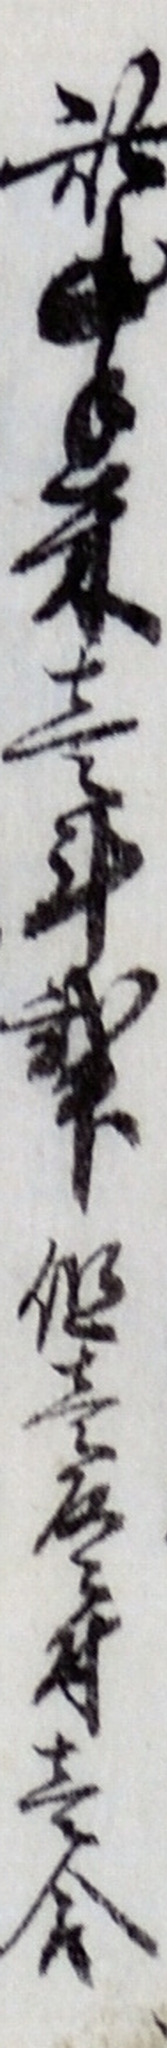此山手米三斗六升但壱反ニ付壱合
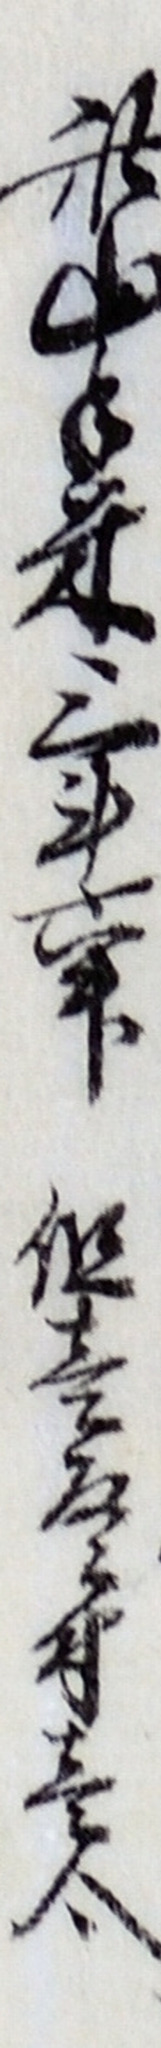此山手米三斗六升但壱反ニ付壱合
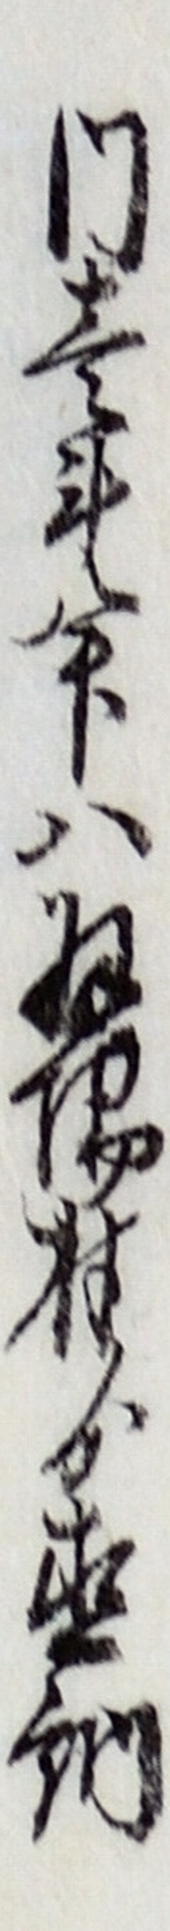内壱斗八升ハ羽場村より直納
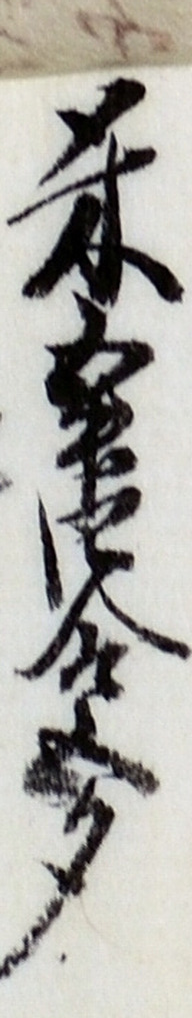米五升四合五勺
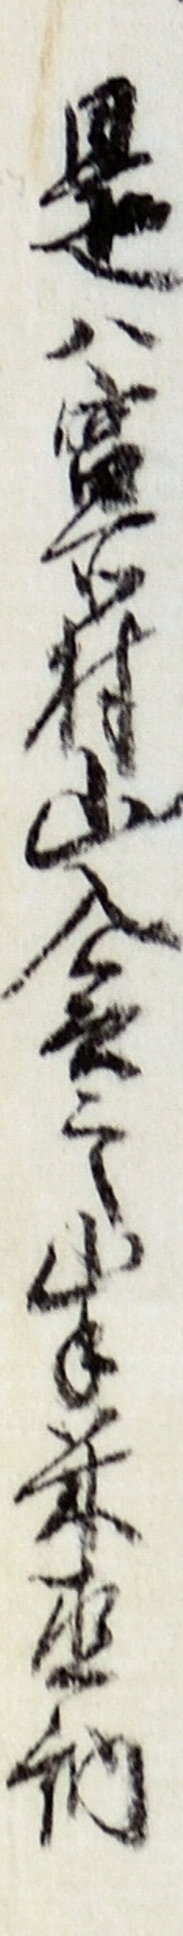是ハ宮所村山入会之山手米直納

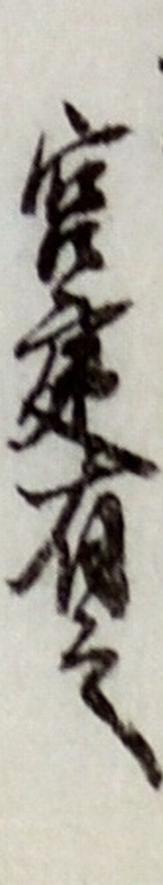宮建有之
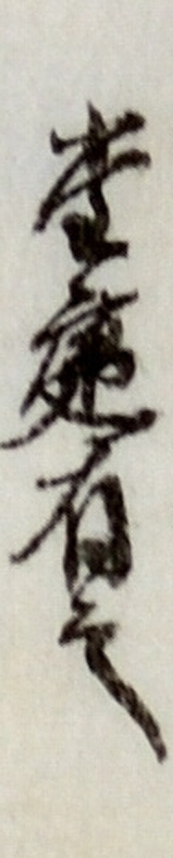宮建有之
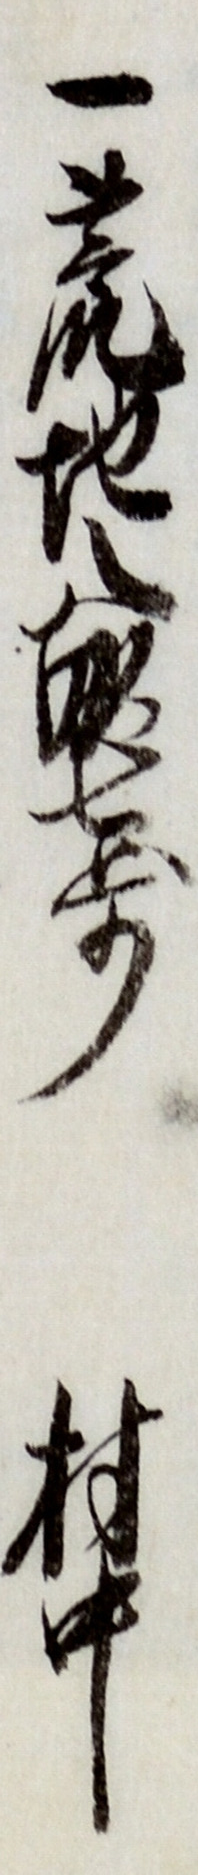一荒地八畝七歩村中
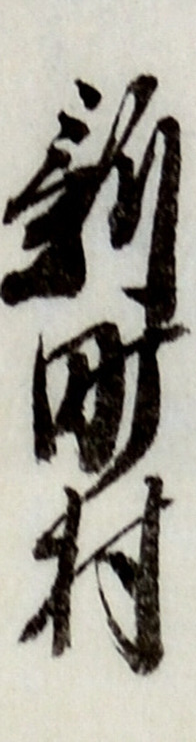新町村
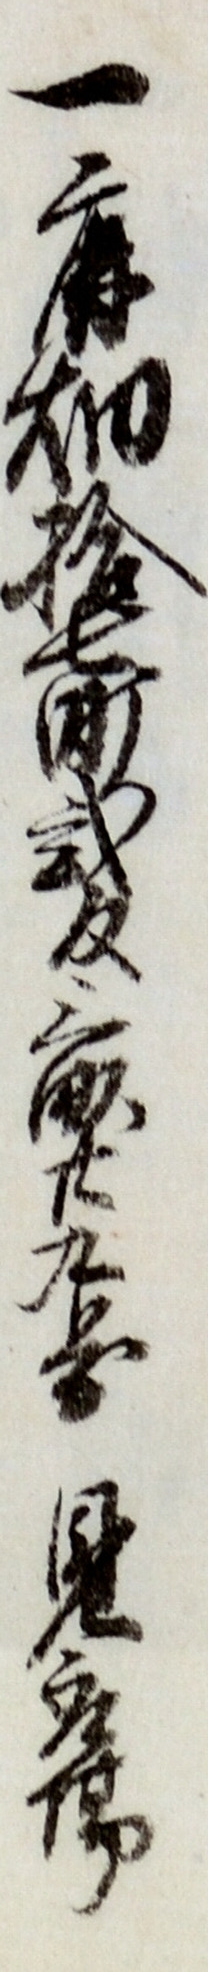一麻畑拾七町弐反三畝廿九歩見取場
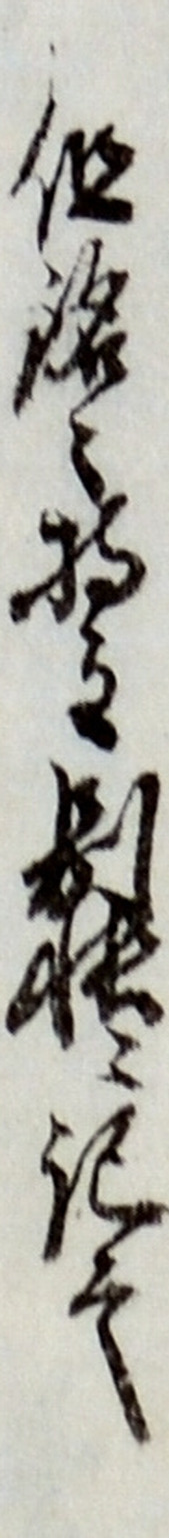但銘々持主別帳ニ記之
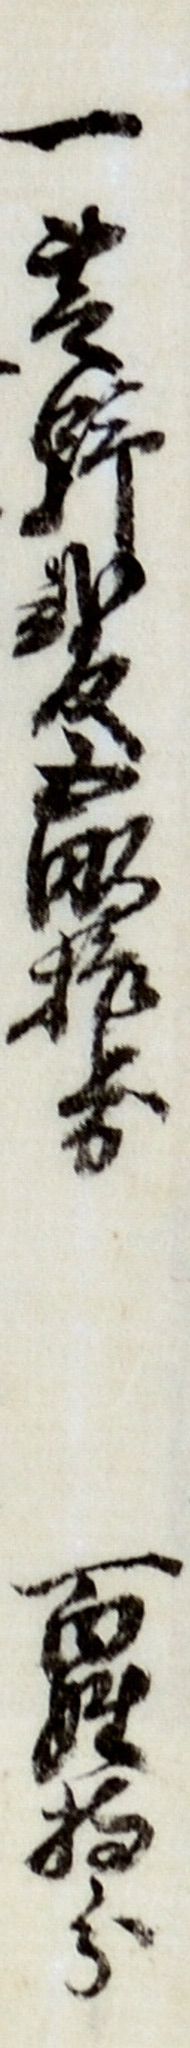一芝野弐反五畝拾歩百姓持分
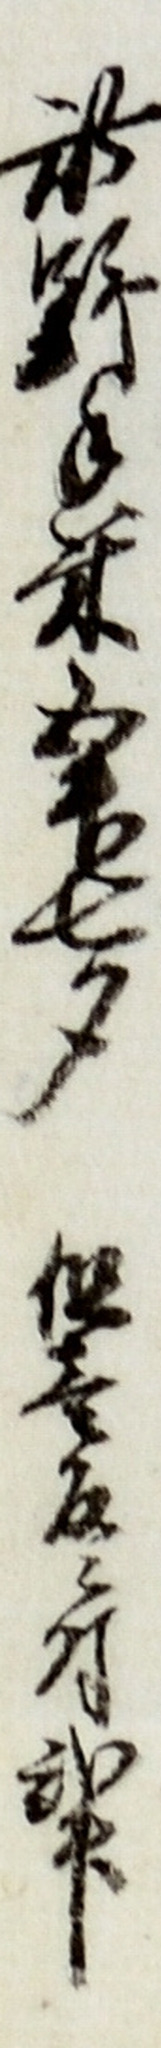此野手米五升七勺但壱反ニ付弐升
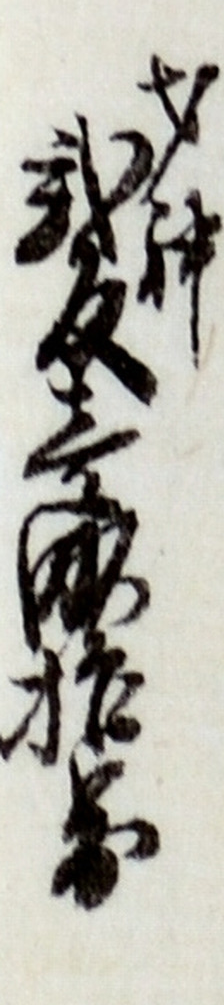弐反壱畝拾歩村中
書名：御領分中山林社地手控
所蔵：伊那市立高遠町図書館・合同会社AMANE
